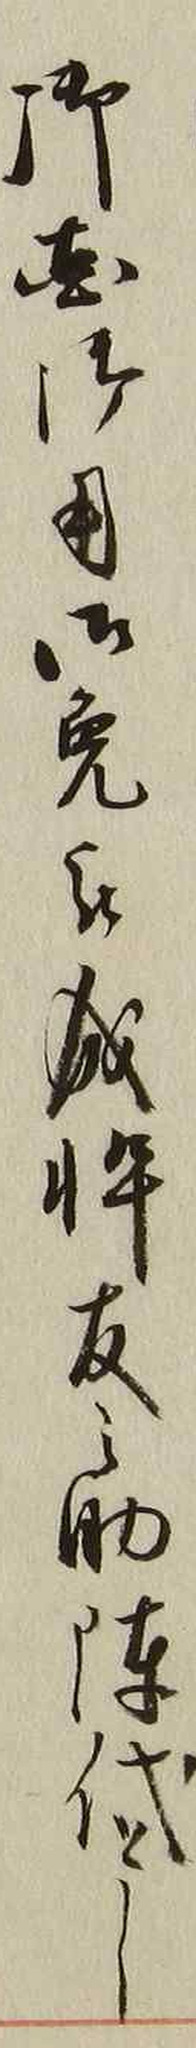御固御用御免被成忰友之助陣代とし
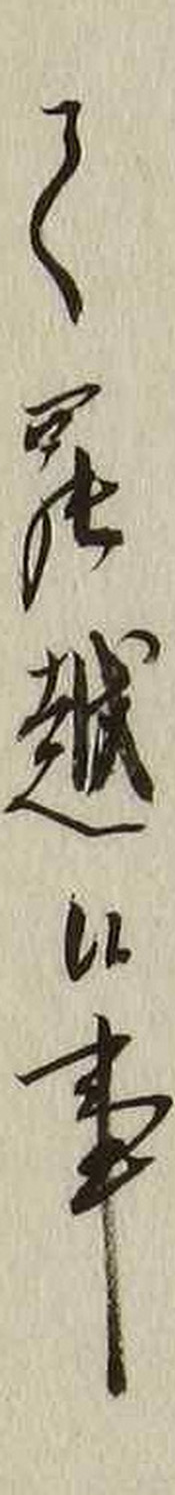て罷越候事
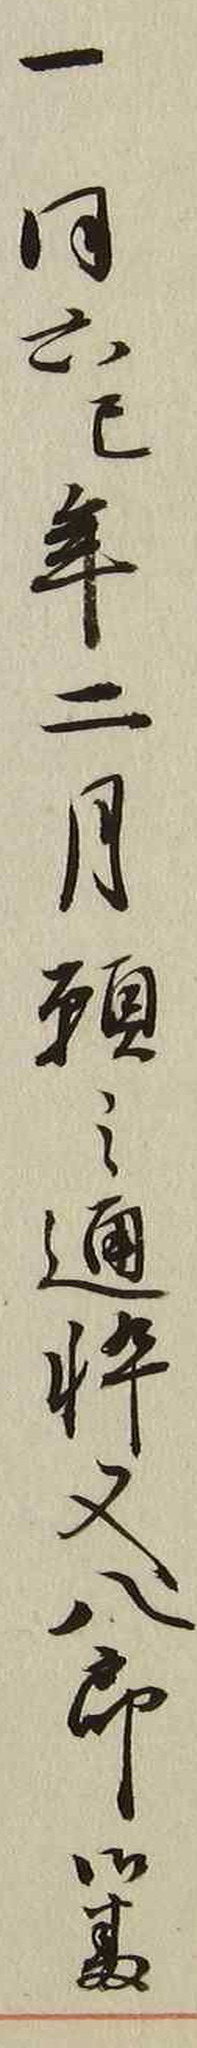一同六巳年二月願之通忰又八郎御番
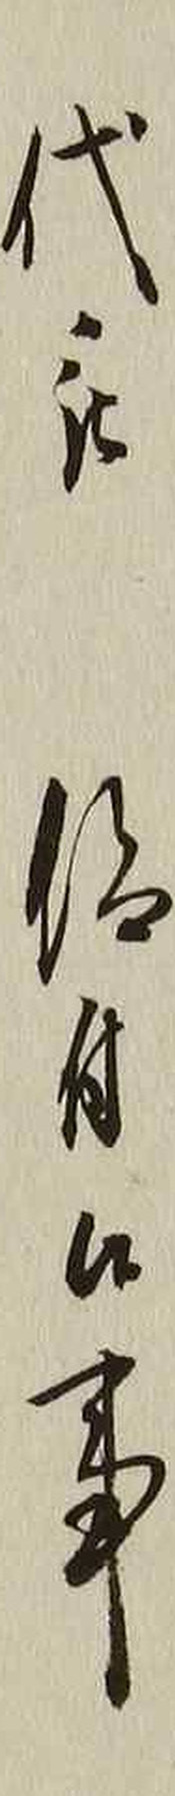代被仰付候事
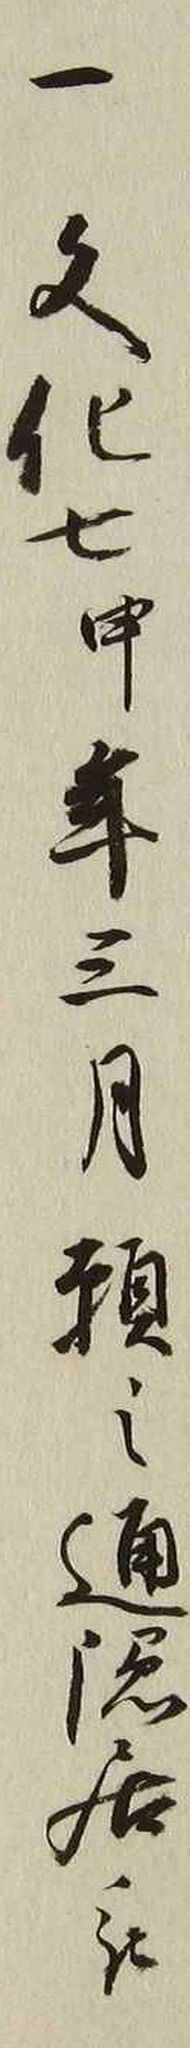一文化七申年三月願之通隠居被
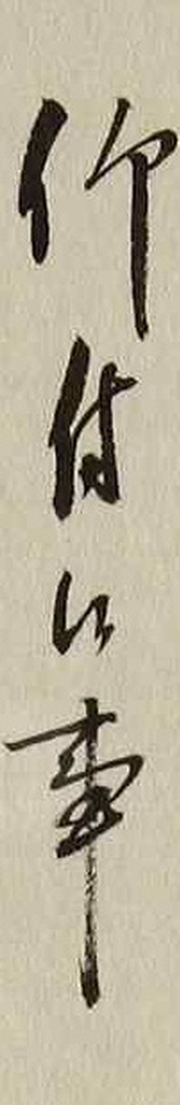仰付候事
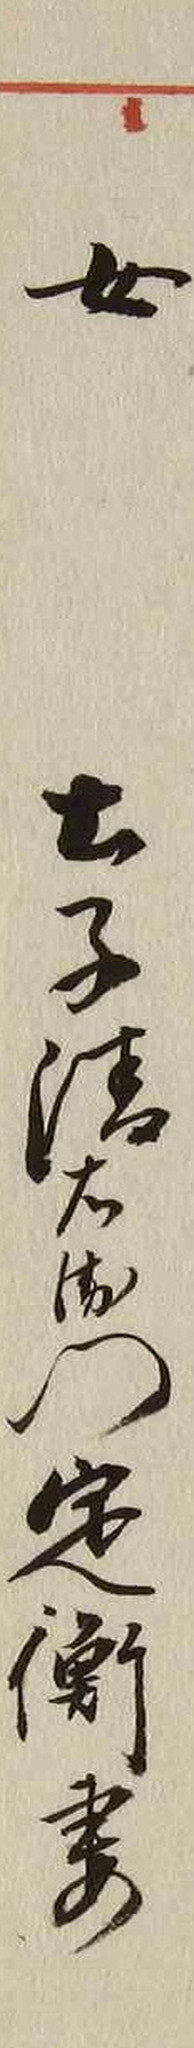女土子清右衛門定衡妻
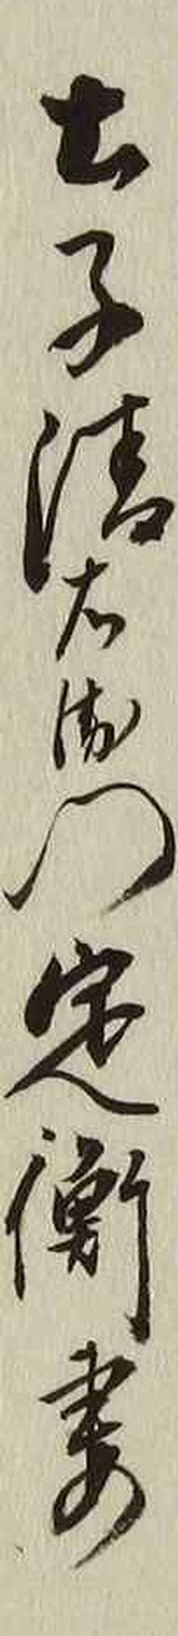女土子清右衛門定衡妻
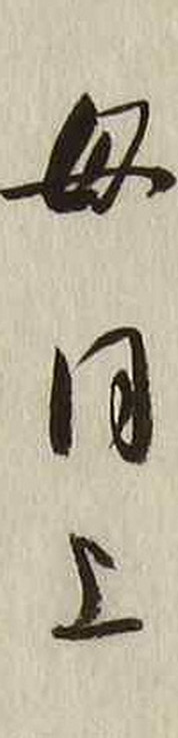母同上
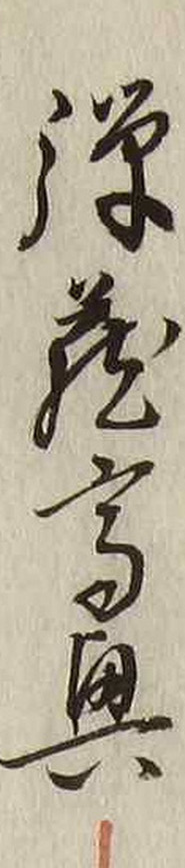弾蔵高奥
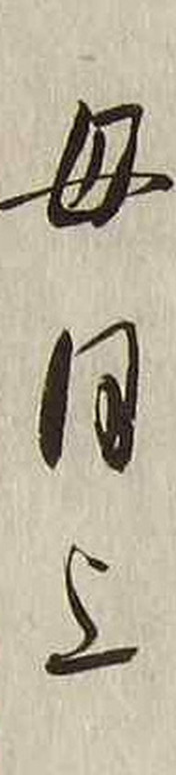母同上
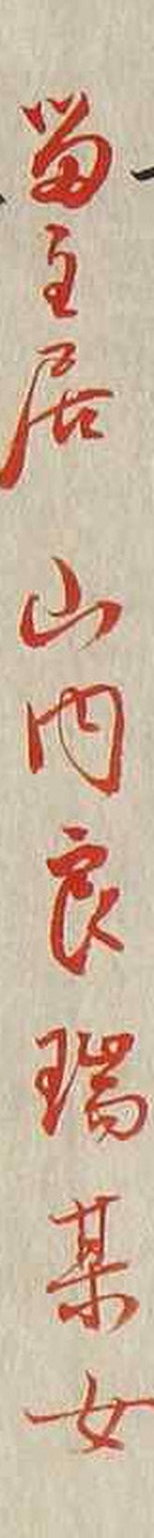留守居山内良瑞某女
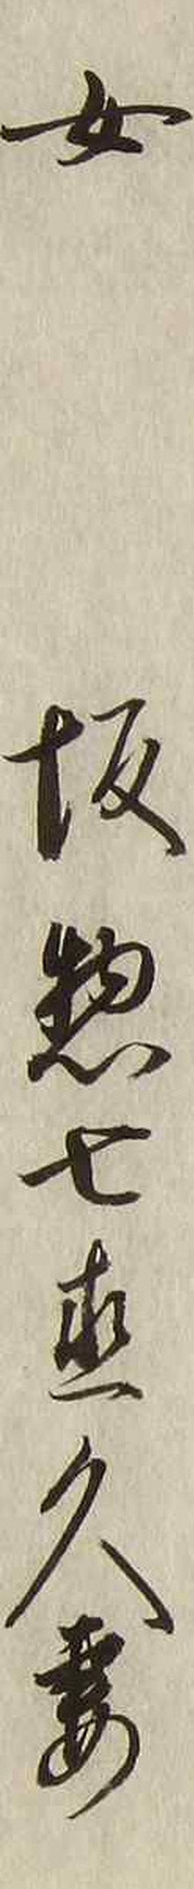女坂惣七直久妻
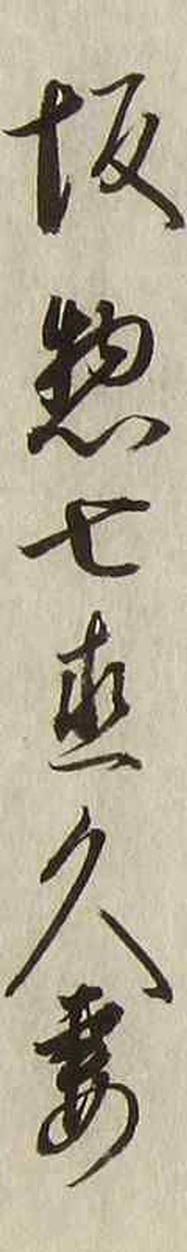女坂惣七直久妻

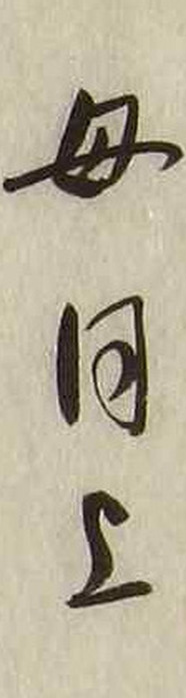母同上
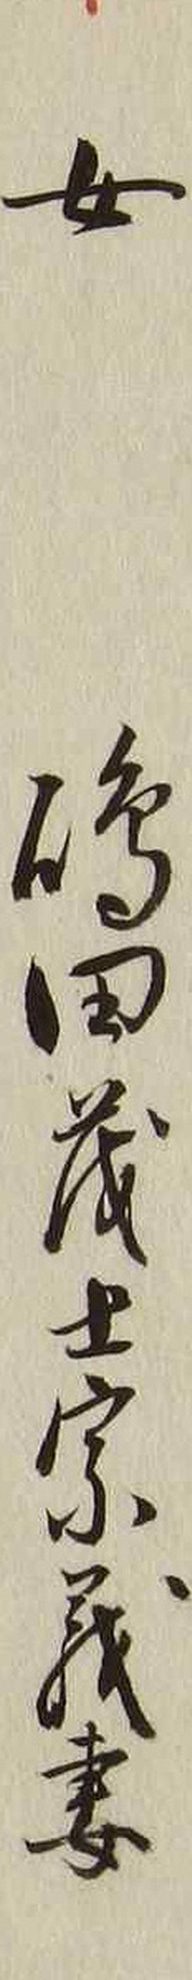女嶋田茂士宗義妻
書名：諸士系譜　巻之22　い之部22
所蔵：会津若松市立会津図書館
